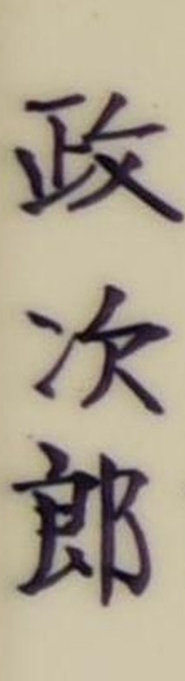政次郎

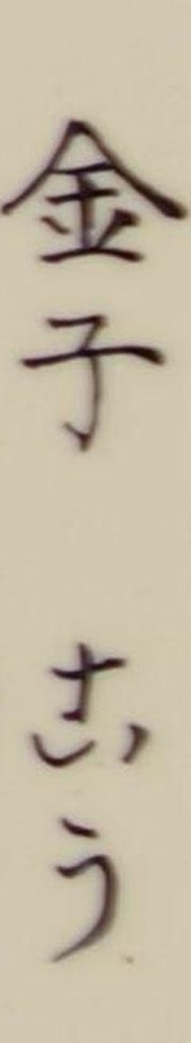金子こう
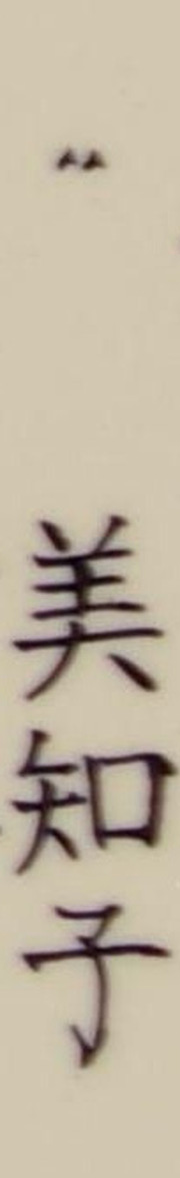美和子
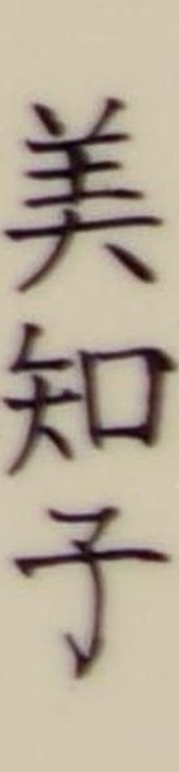美和子
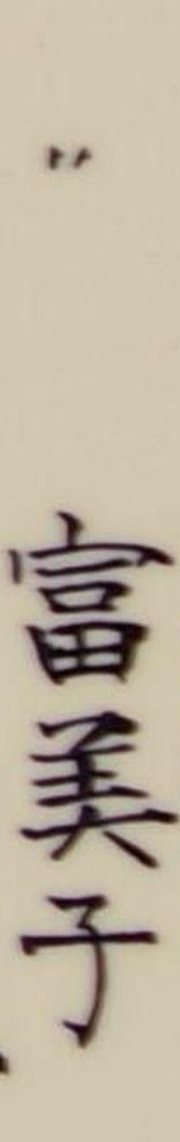富美子
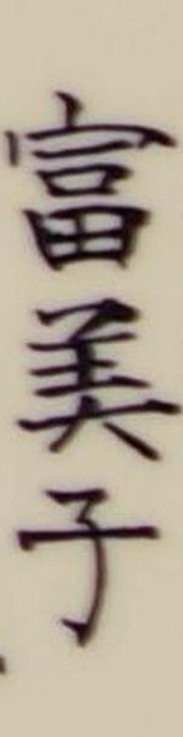富美子
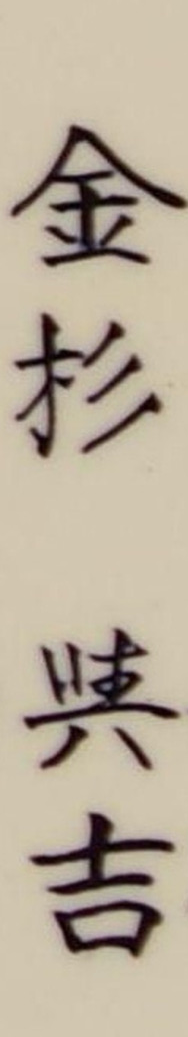金杉与吉
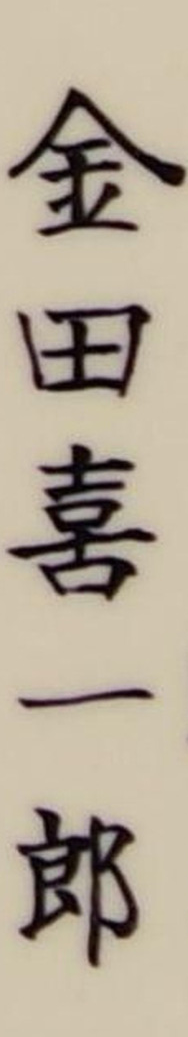金田喜一郎
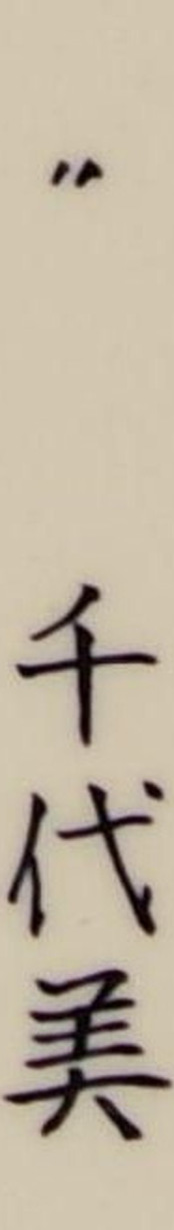千代美
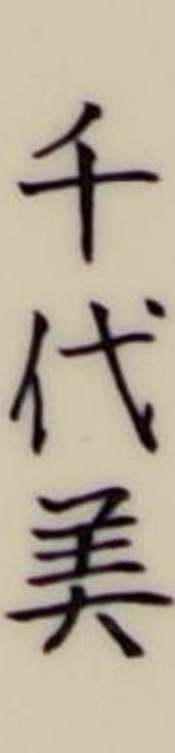千代美
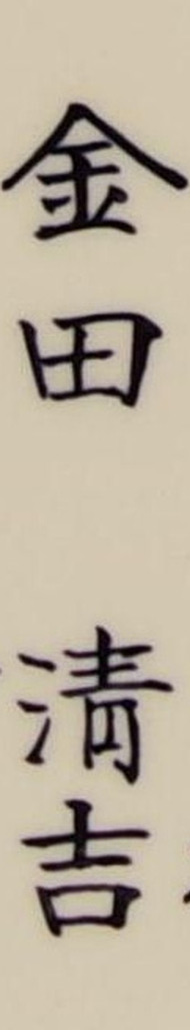金田清吉
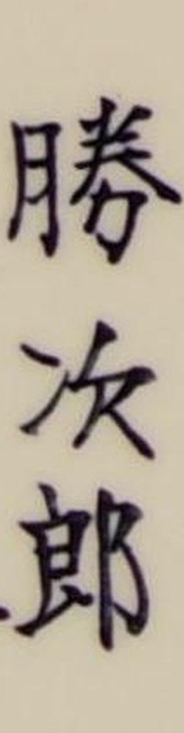勝次郎
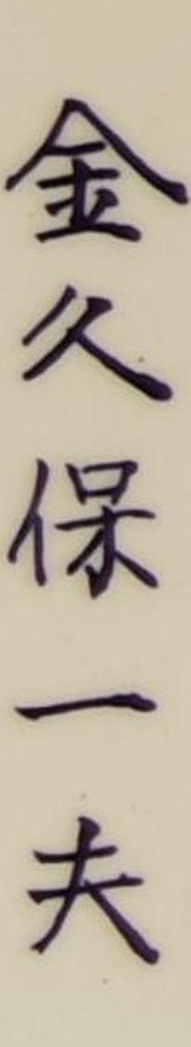金久保一夫
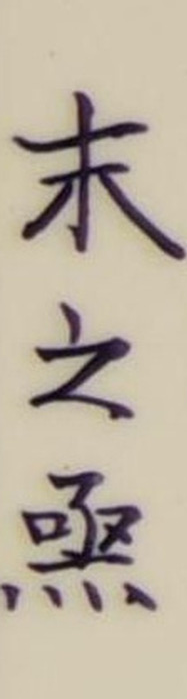末之丞

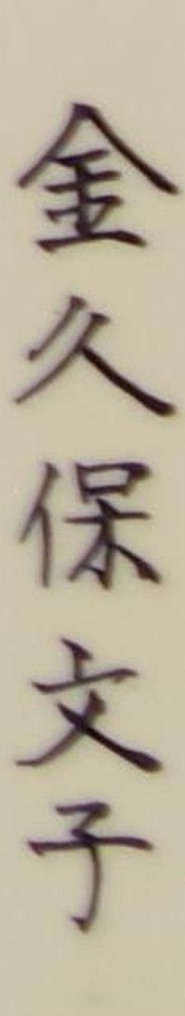金久保文子
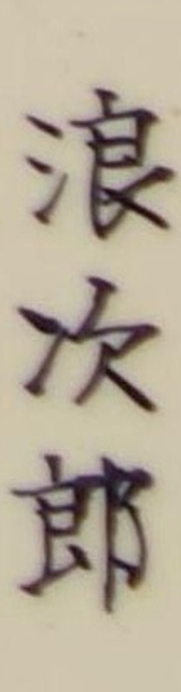浪次郎
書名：A~D
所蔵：koyasan kongobuji
